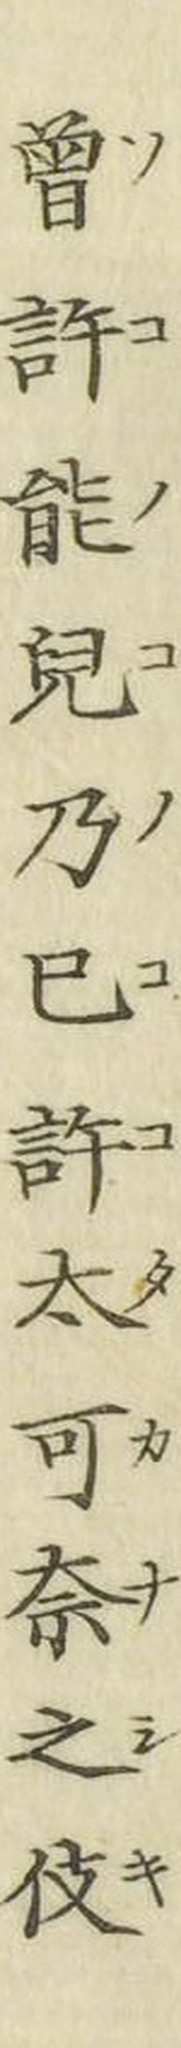曽許能児乃巳許太可奈之伎
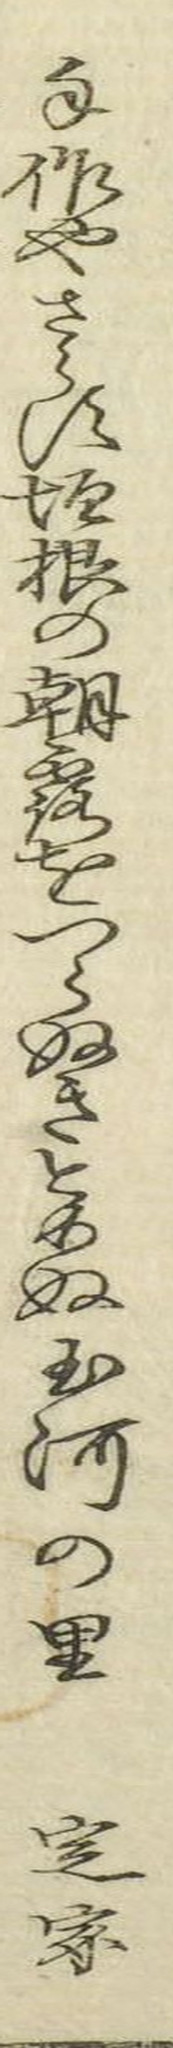手作やさらす垣根の朝露をつらぬきとめぬ玉河の里定家
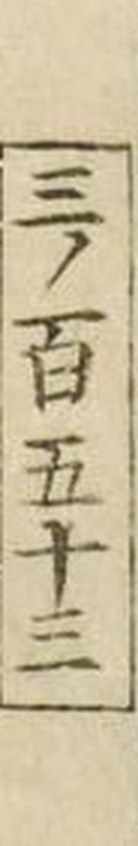三ノ百五十三
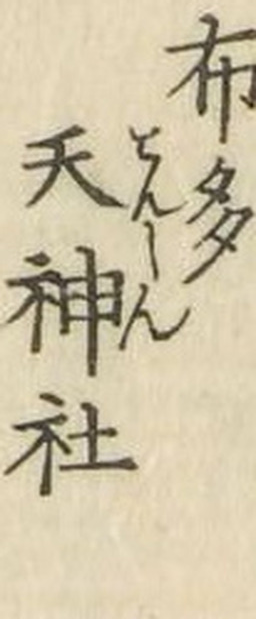天神社

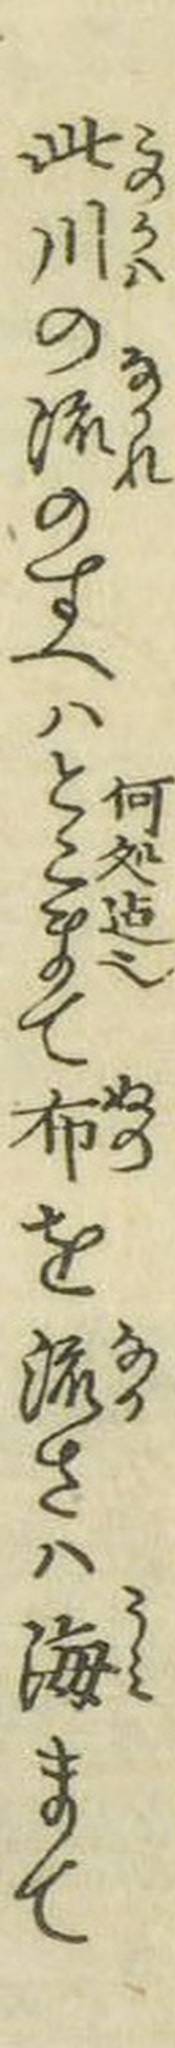此川の流のすへはとこまて布を流さは海まて
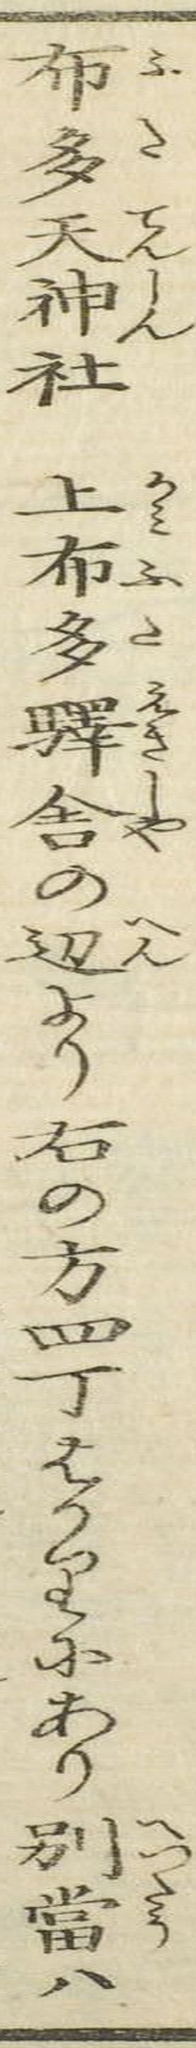布多天神社上布多駅舎の辺より右の方四丁はかりにあり別当は
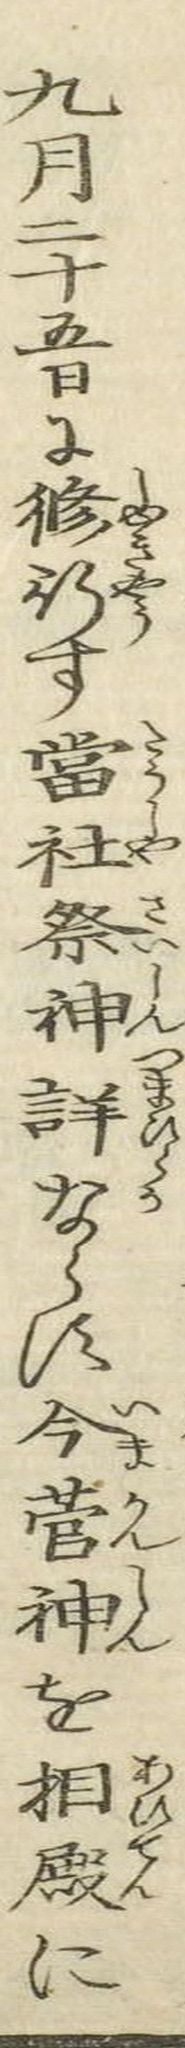九月二十五日に修行す当社祭神詳ならす今菅神を相殿に
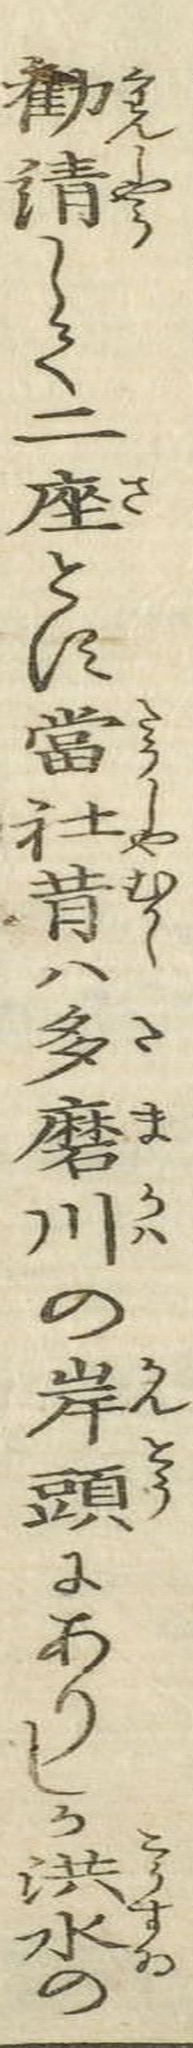勧請して二座とす当社昔は多磨川の岸頭にありしか洪水の
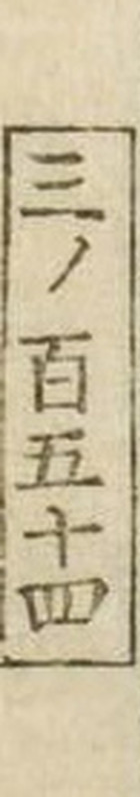三ノ百五十四
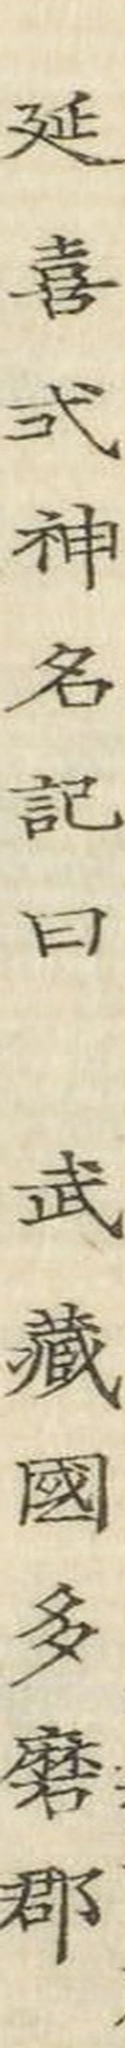延喜式神名記曰武蔵国多磨郡
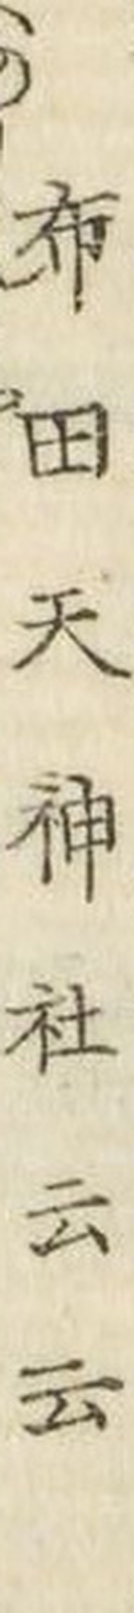布田天神社云々
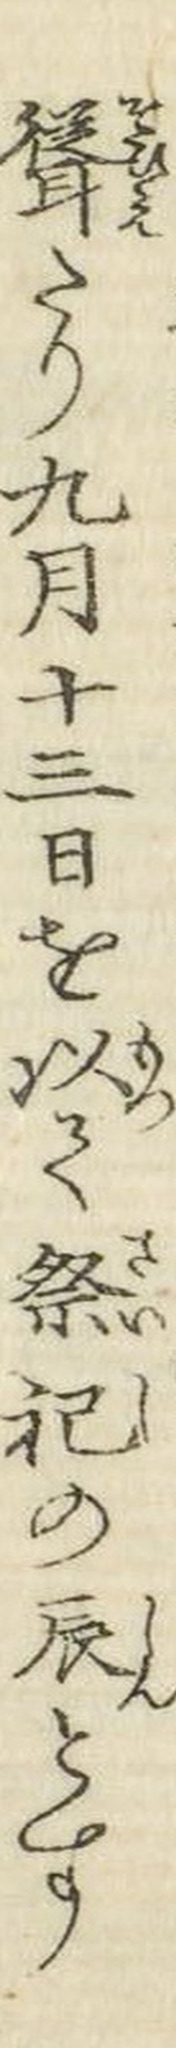聳たり九月十三日を以て祭祀の辰とす
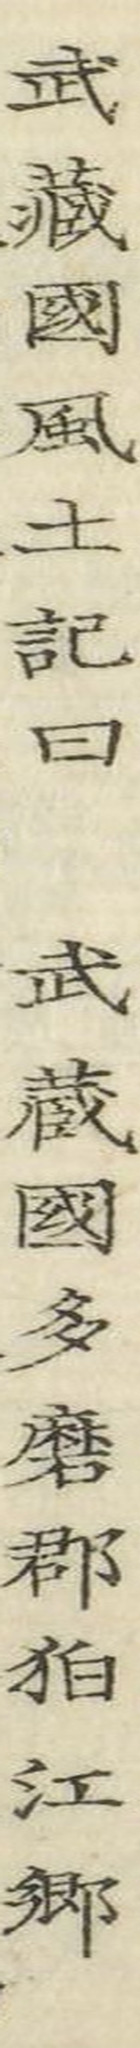武蔵国風土記曰武蔵国多磨郡狛江郷
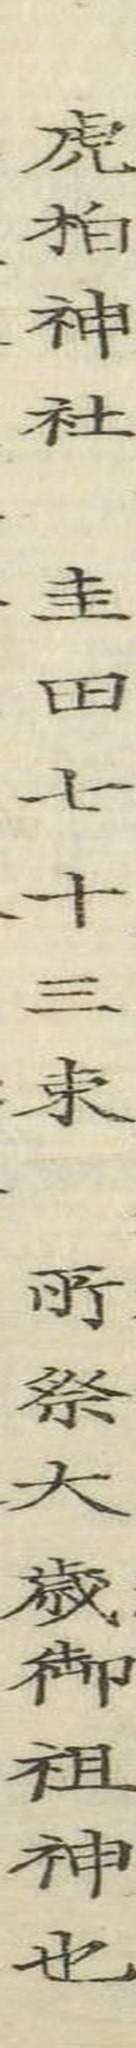虎柏神社圭田七十三束所祭大歳御祖神也
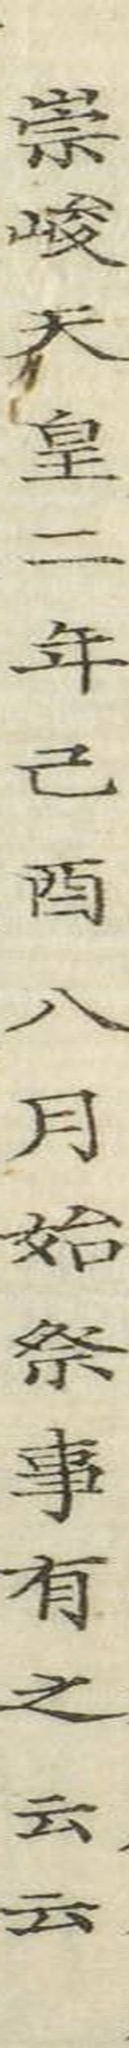崇峻天皇二年己酉八月始祭事有之云云
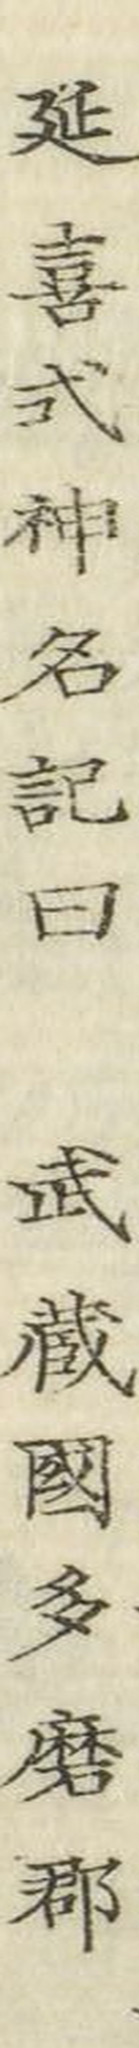延喜式神名記曰武蔵国多磨郡
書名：江戸名所図会 20巻 巻之9
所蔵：東京学芸大学教育コンテンツアーカイブ
